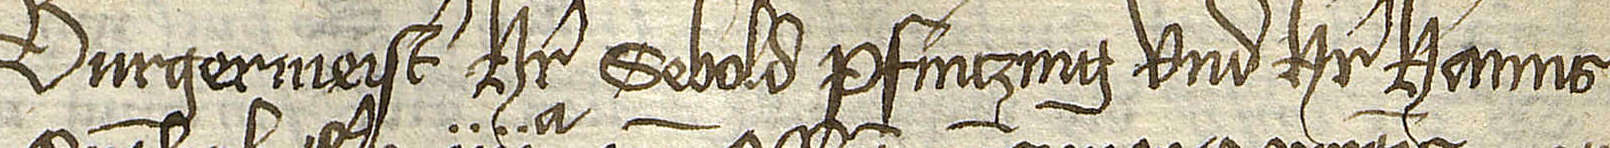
Burgermeiſt* H*r Sebold Pfincʒing Vnd Hr* Hanns
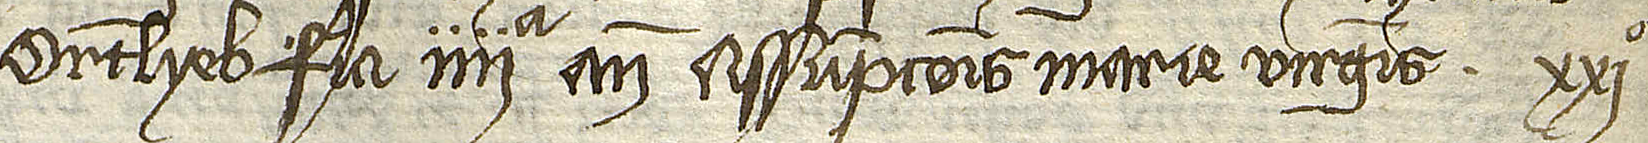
Ortlyeb fia* iiii* an* Aſſupcois* marie virgis* . xxi*
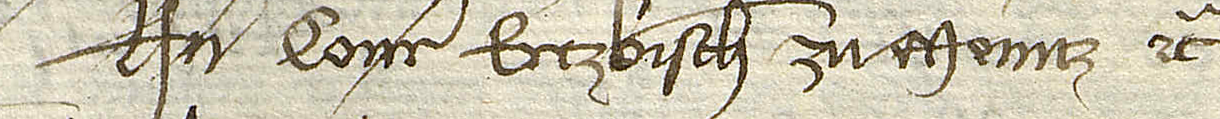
Hn* Conr* Ercʒbiſch* ʒu Meincʒ ec*
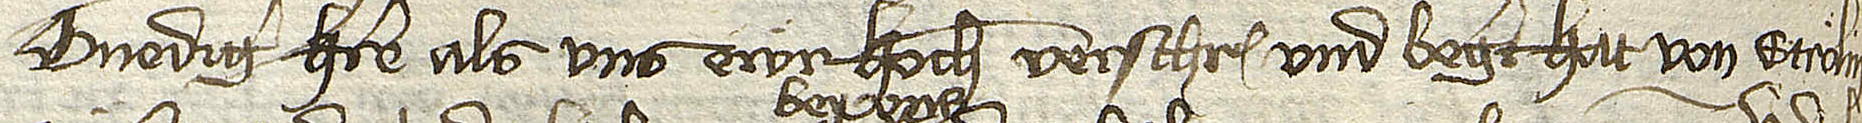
Gnedig* hre* als vns ewr hoch* verſchr* vnd begt* hat von Strölin
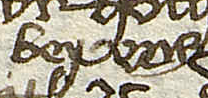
bey vns
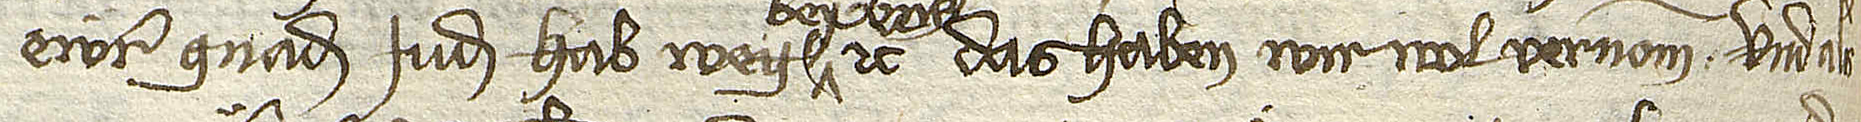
ewr gnad* Iud* weg* ec* das haben wir wol vernom* . Vnd als
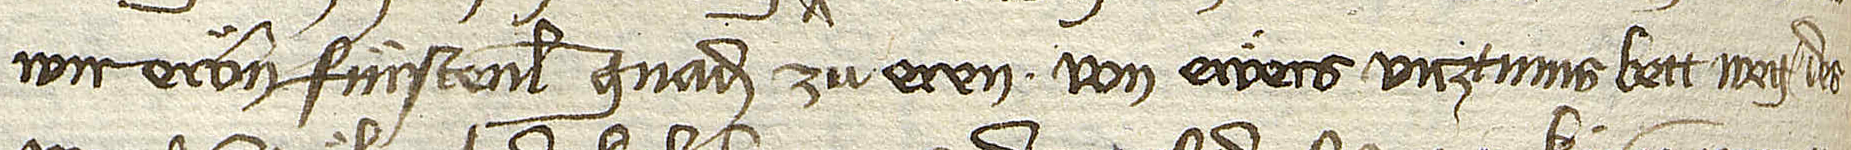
wir ewn* fürſtenl* gnad* ʒu eren . von ewers vicʒtums bett weg* des
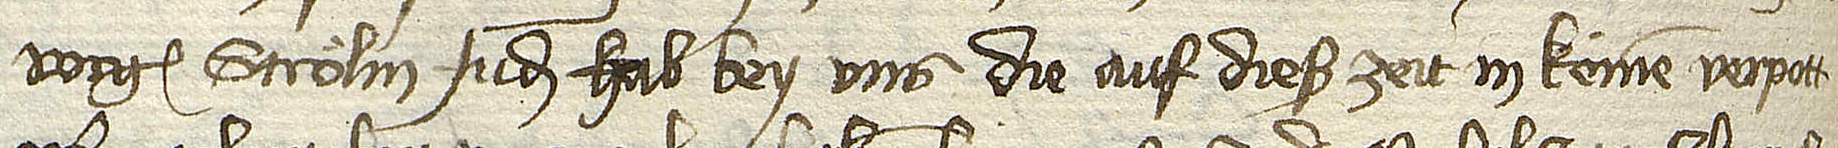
vorg* Strölin Iud* hab bey vns die auf dieſ* ʒeit in keine* verpott
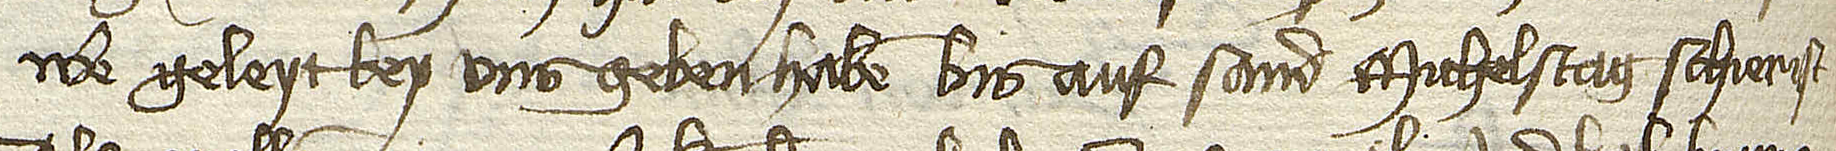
we* geleyt bey vns geben habe* bis auf ſand Michelſtag ſchieriſt
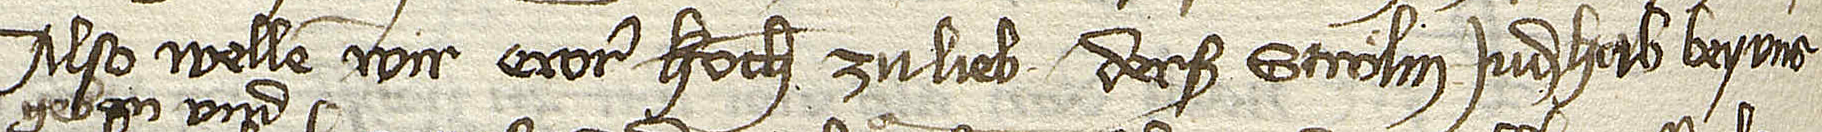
Alſo welle* wir ewr* hoch* ʒu lieb / derſ* Strölin Iud* hab bey vns
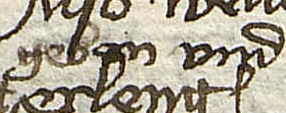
geben vnd
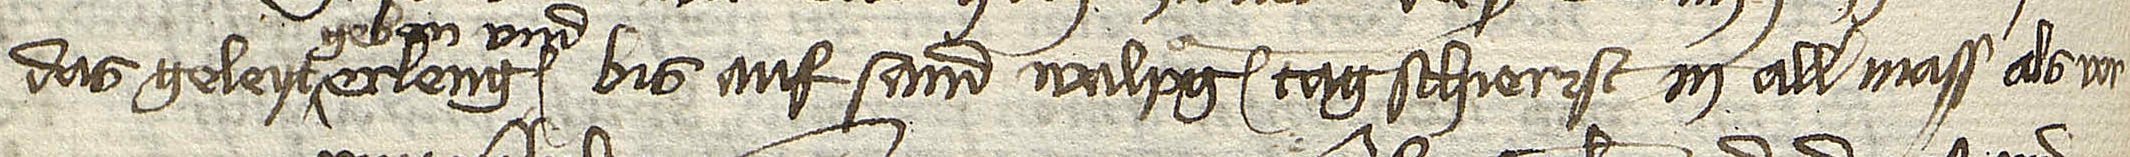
das geleyt erleng* bis auf ſand walp*g* tag ſchieriſt in all* maſſ als vor
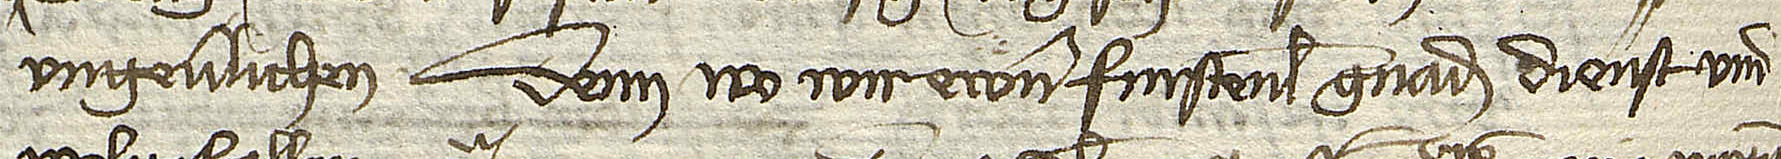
vngeu*lichen Denn wo wir ewn* furſtenl* gnad* dienſt vnd
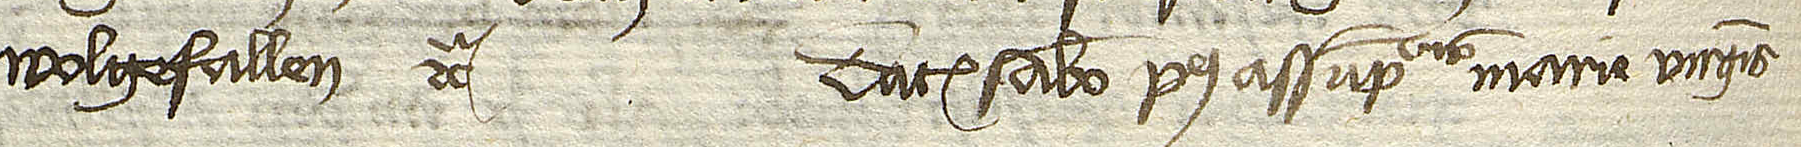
wolgefallen ec* Dat* ſabo* p* aſſup* marie virgis*
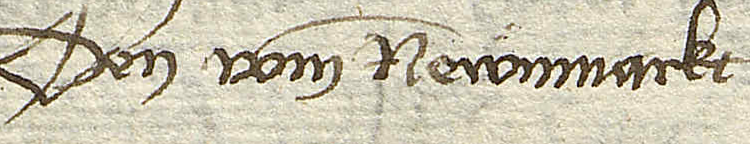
Den vom* Newnmarkt
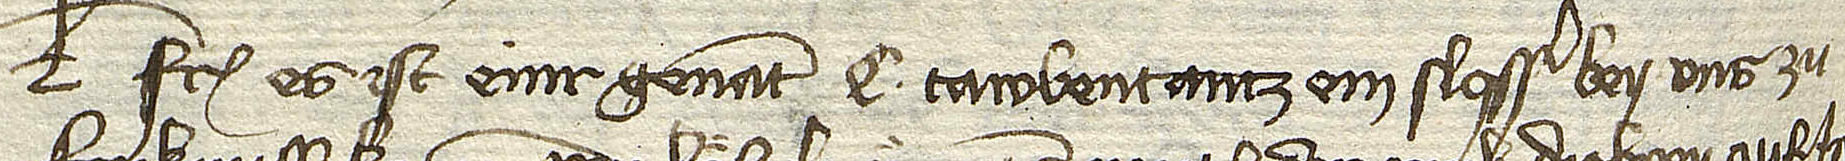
L* fr* es iſt einr genat* C . tawbentancʒ ein ſloſſ* bey vns ʒu
